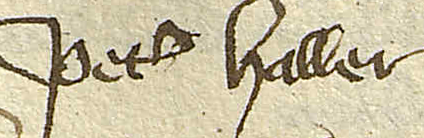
Pet* haller
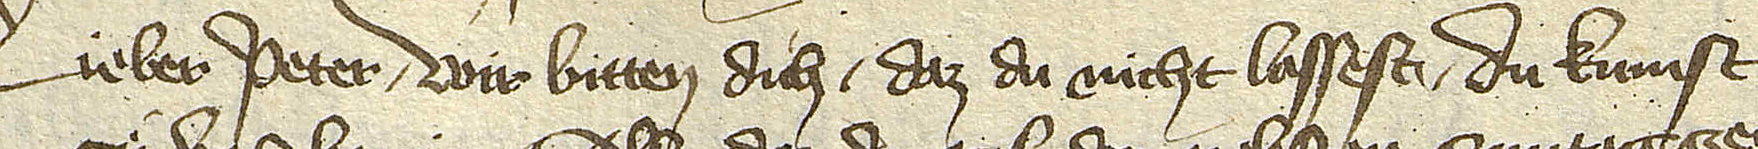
Lieber Peter / Wir bitten dich / daʒ du nicht laſſeſt / Du kumſt
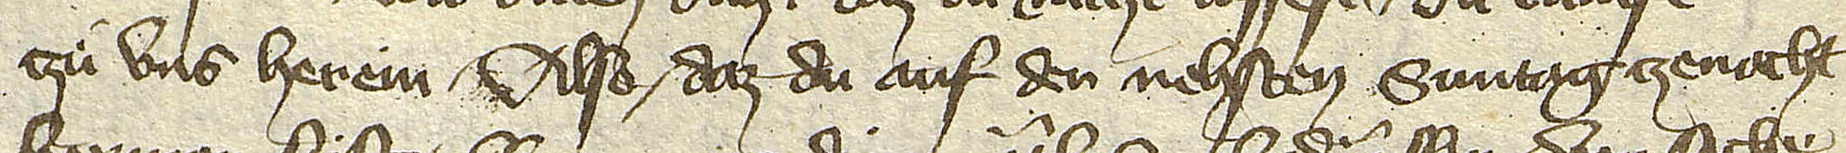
cʒü vns herein / Alſo / daʒ du auf den nehſten Suntag cʒenacht
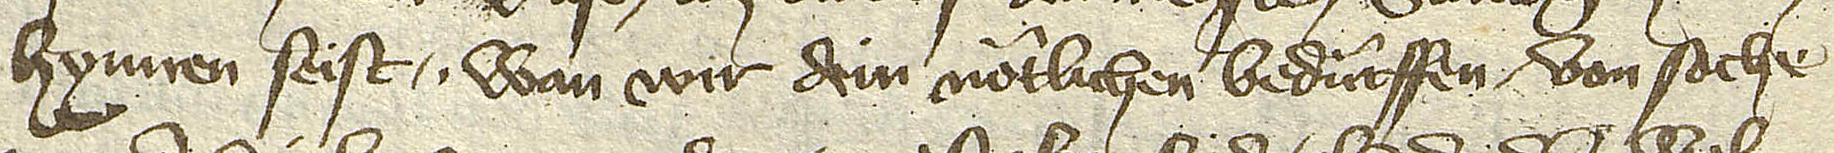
hynnen ſeiſt / . wan wie dein nötlichen bedürffen / von ſache
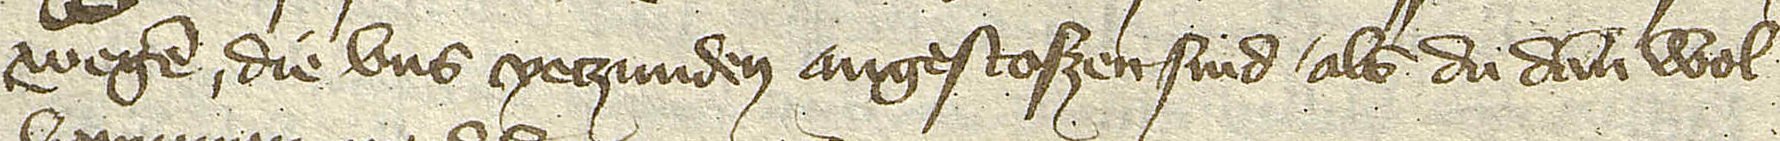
wege* / die vns yecʒunden angeſtoſʒen ſind / als du dan* wol
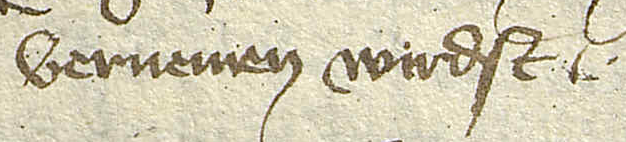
vernemen wirdſt / .
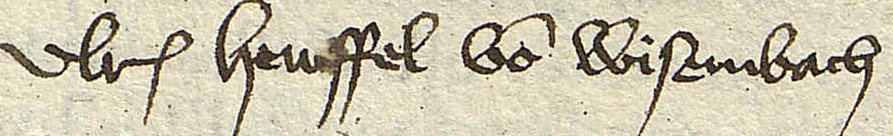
vlr* Hewffel vo* wiſembach
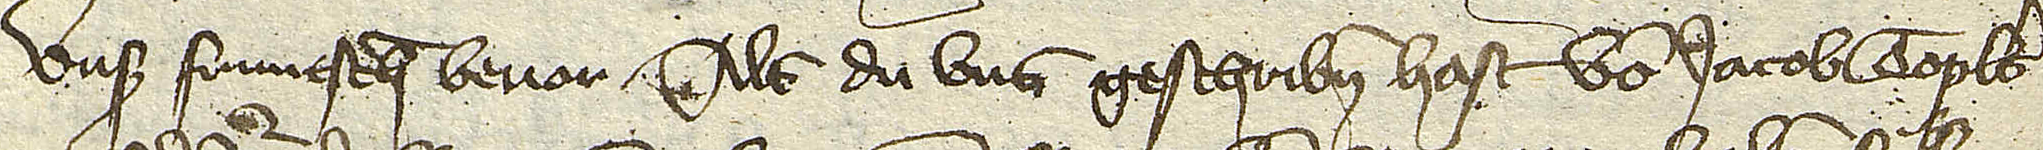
Vnſ* fruntſch* beuor / Als du vns geſchribn* haſt vo* Iacob Topls*
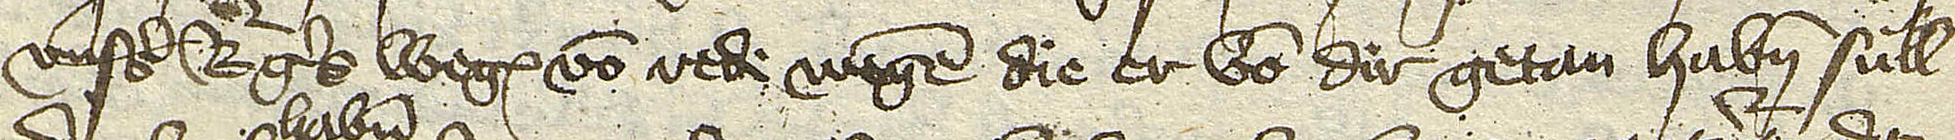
vnſs* B*g*s weg* vo* rede wege* die er vo* dir getan habn* ſüll
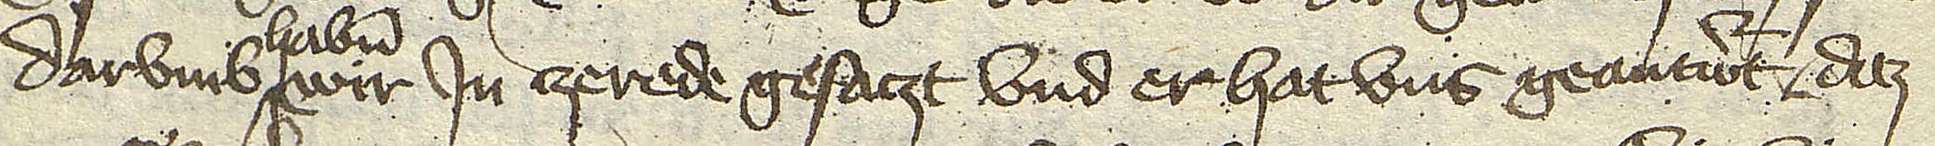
darvmb wir In cʒerede geſacʒt vnd er hat vns geantwt* / daʒ
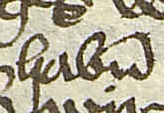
habn*
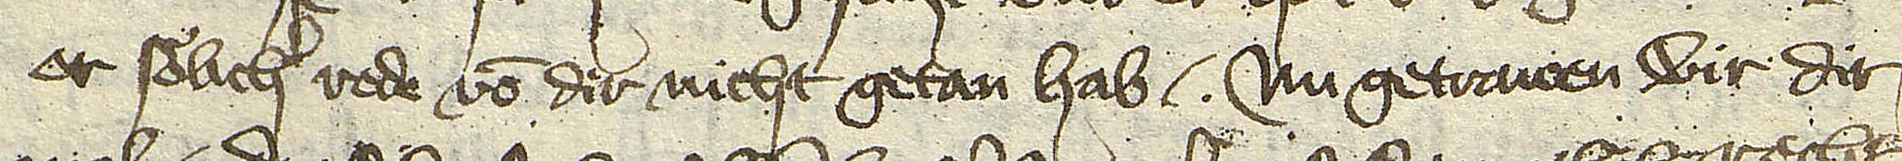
er ſölich* rede vo* dir nicht getan hab / . Nu getrawen wir dir
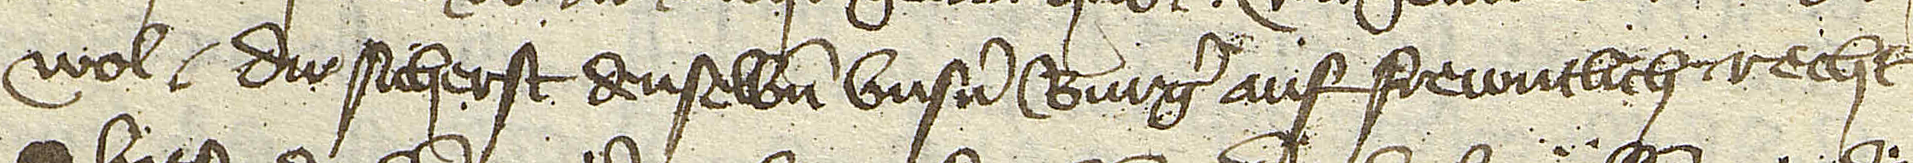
wol / du ſicherſt denſelbn* vnſn* Burg* auf frewntlich recht
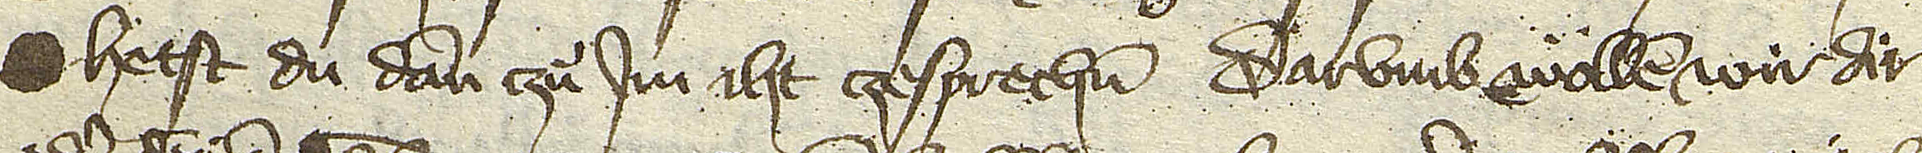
hetſt du dan* cʒü Im iht cʒeſprechn* Darvmb wölle* wir dir
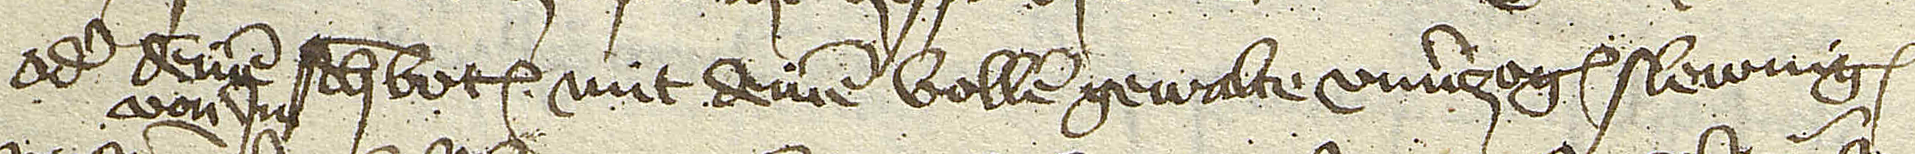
od* deine* ſch*bot* mit deine* volle* gewalte vnu*cʒog* ſlewnig*
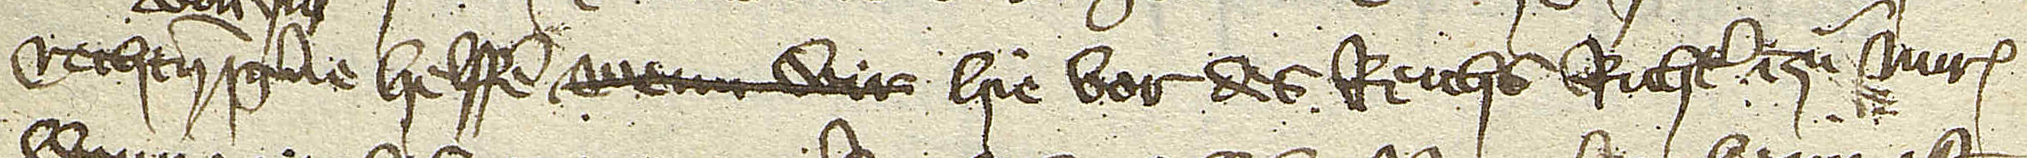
rechtn* gn*e helffe* / wenn wir hie vor des Reichs Richt* cʒu Nur*
